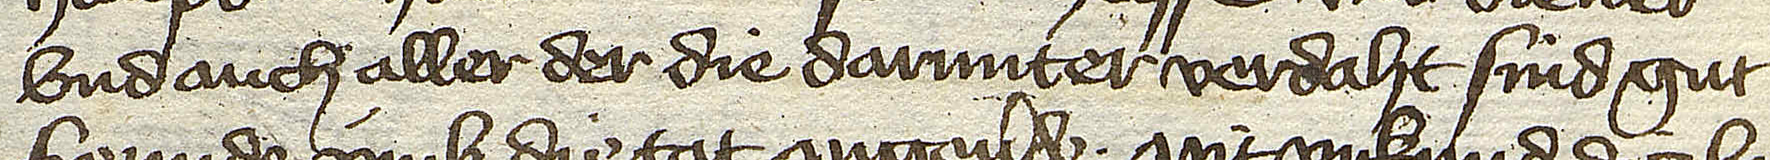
vnd auch aller der die darunter verdaht ſind gut
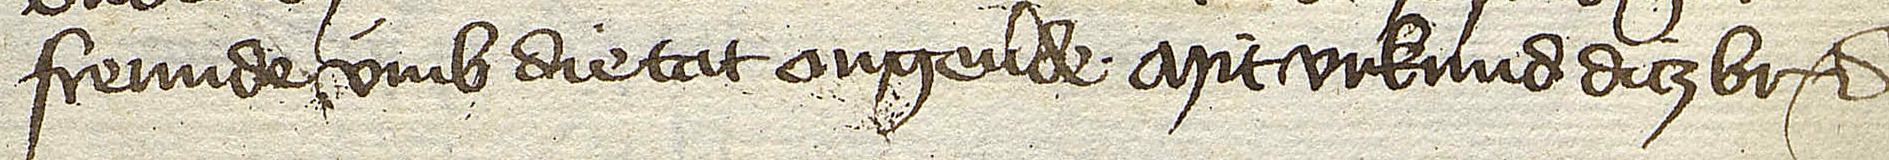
freunde v̈mb die tat ongeu*de . Mit vrk* dicʒ br* ec*
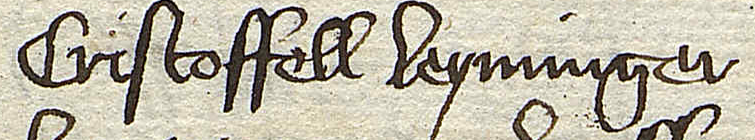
Criſtoffell Leyninger
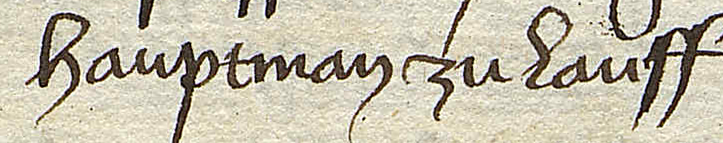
hauptman cʒu Lauff
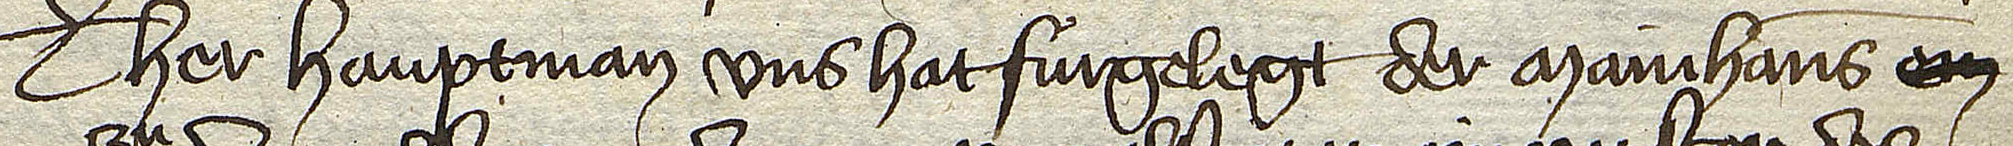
L* her hauptman vns hat fürgelegt der Mainshans* ein
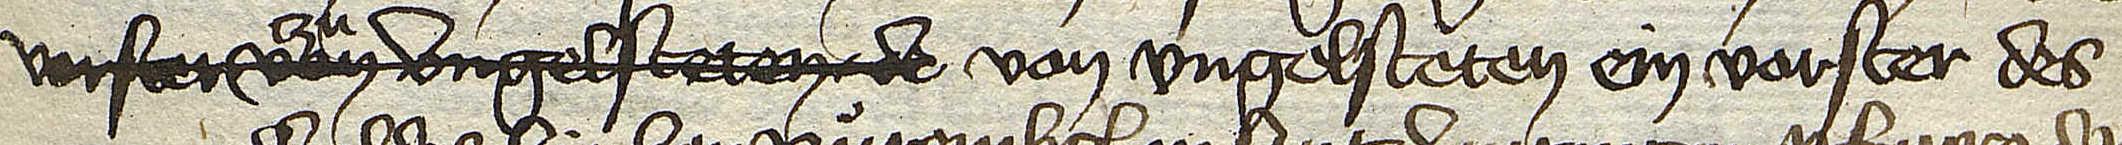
vorſter von Vngelsteten / de von Vngelſteten ein vorſter des
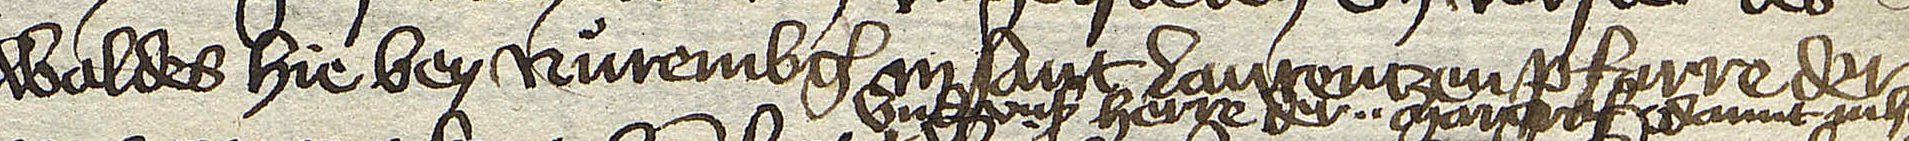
waldes hie bey Nürembg* in ſant Laurencʒen pfarre der
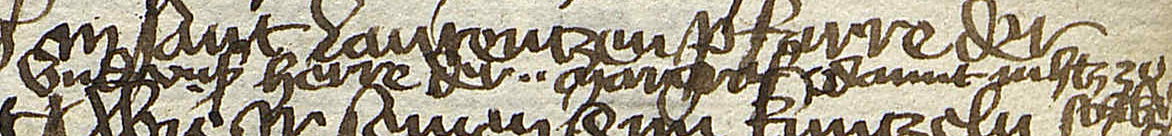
vnd vnſ* herre der ~ Margraf / damit nihtʒ ʒu
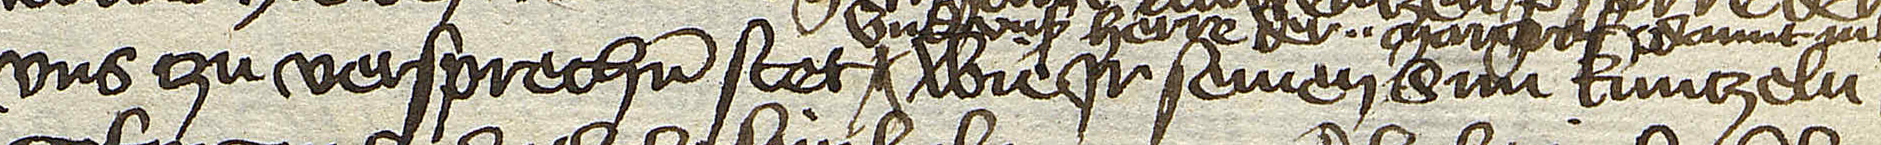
vns cʒu verſprechn* ſtet / wie Ir ſeinen Sun kuncʒeln
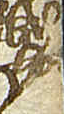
hat
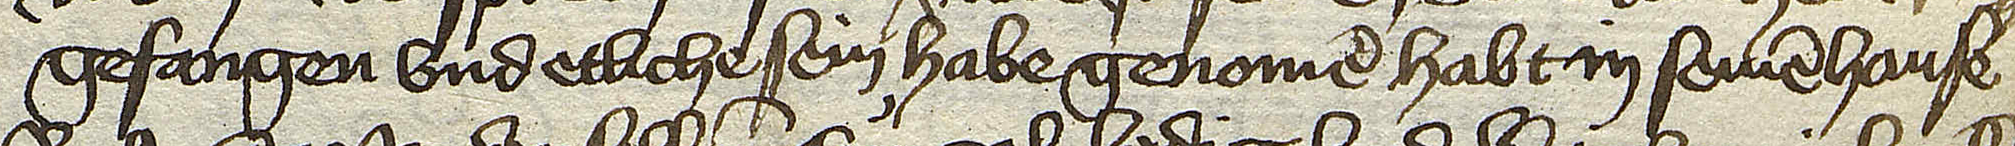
gefangen vnd etliche ſein habe genome* habt in ſeine* hauſe
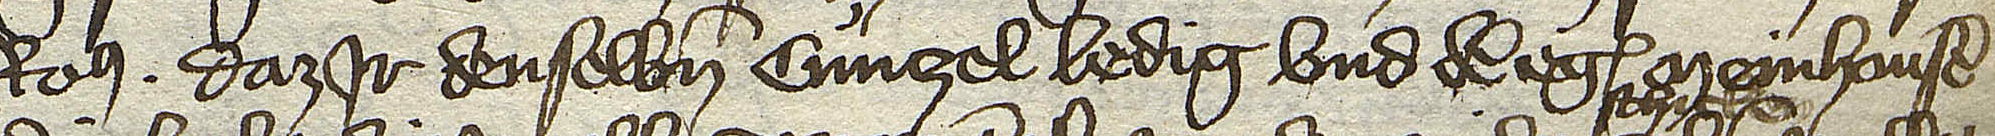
Ro* . daʒ Ir denſelbn* Cüncʒel ledig vnd d* eg* Meinhauſe*
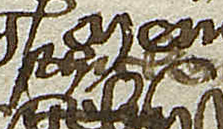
ſchicken
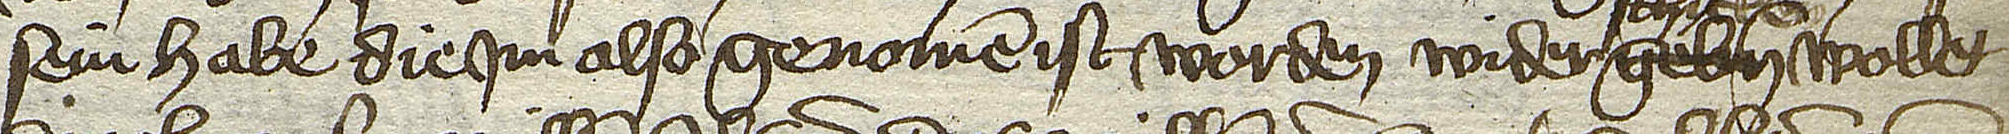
ſein habe die Im alſo genome* iſt worden widergebn* wollet
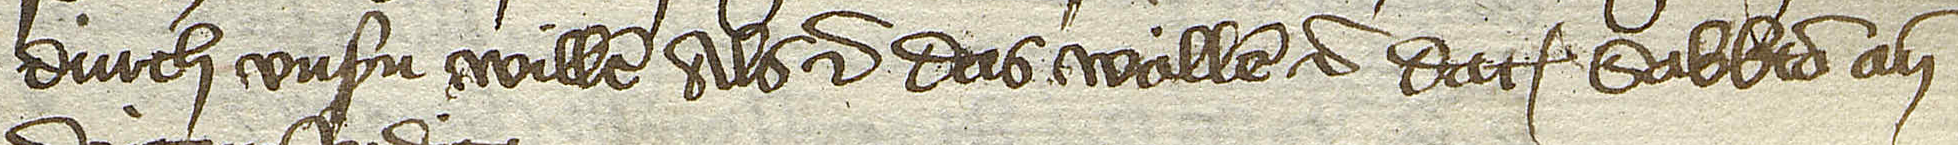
durch vnſ*n wille* Als ec* das wölle* ec* Dat* Sabbto* an*
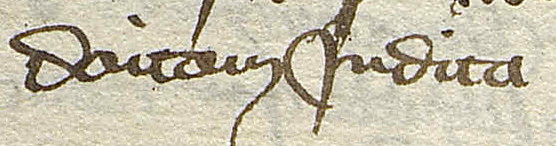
Doicam* Iudica
